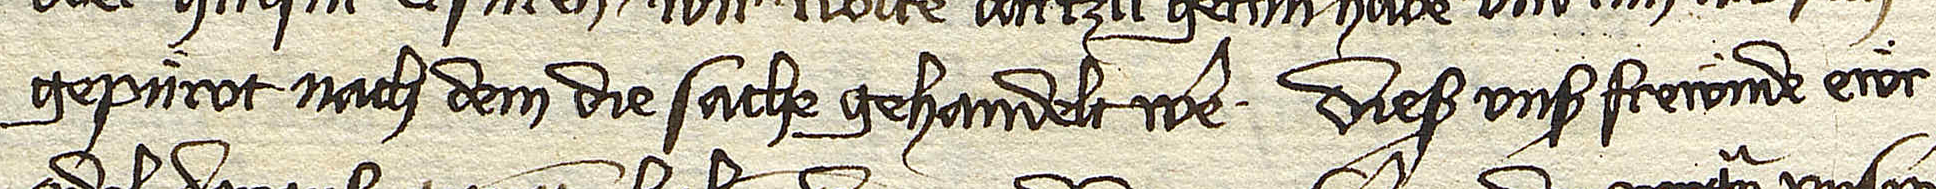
gepürot nach dem die ſache gehandelt we* . Dieſ* vnſ* frewnde ewr
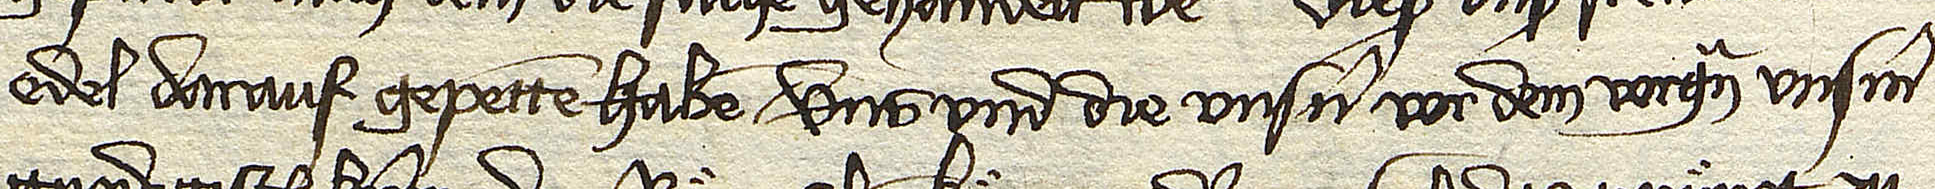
edel darauf gepette* habe* / Vns vnd die vnſ*n vor dem vorg*n vnſ*m
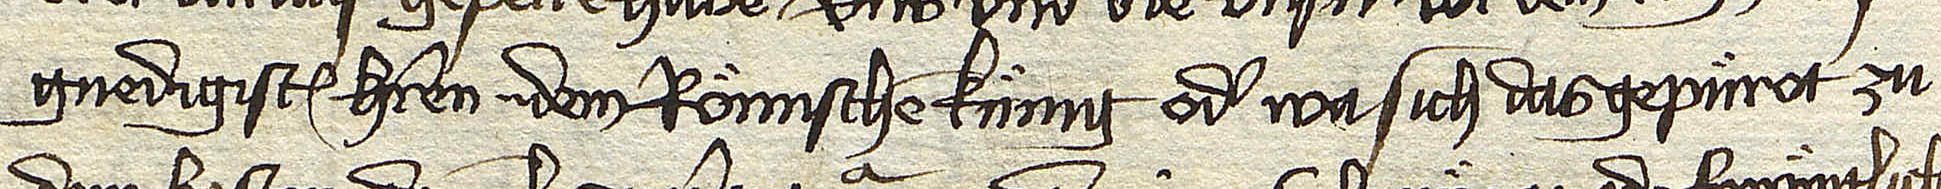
gnedigiſt* h*ren ~ dem Römiſche* künig od* wa ſich das gepürot ʒu
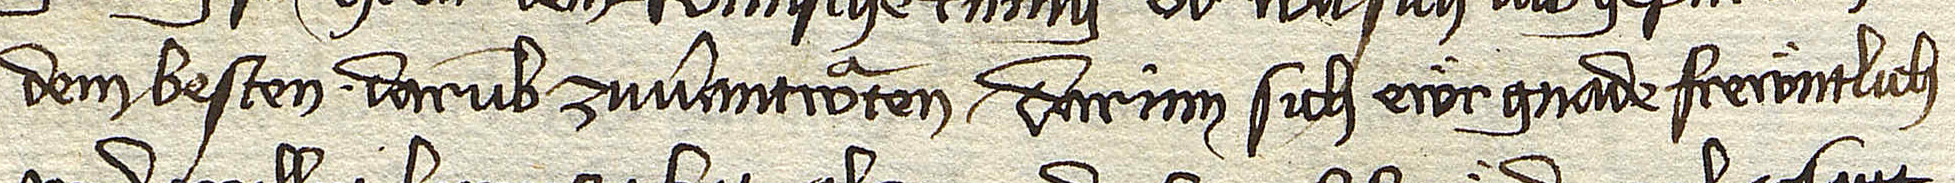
dem beſten . daru*b ʒuu*antw*ten / Darinn ſich ewr gnade frewntlich
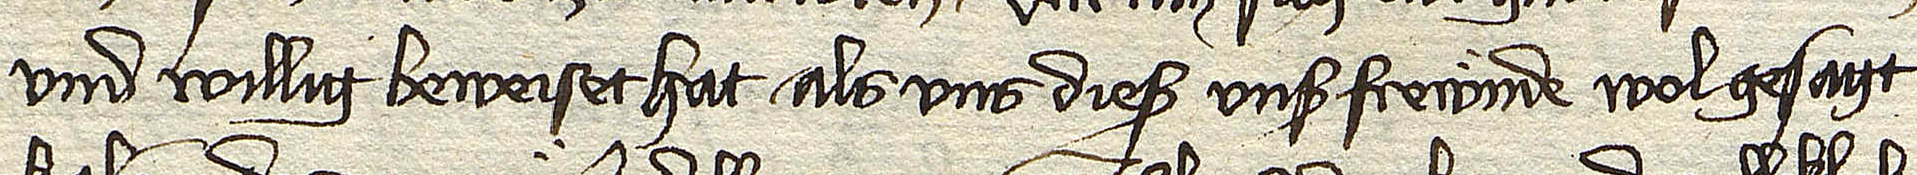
vnd willig beweiſet hat / als vns dieſ* vnſ* frewnde wol geſagt
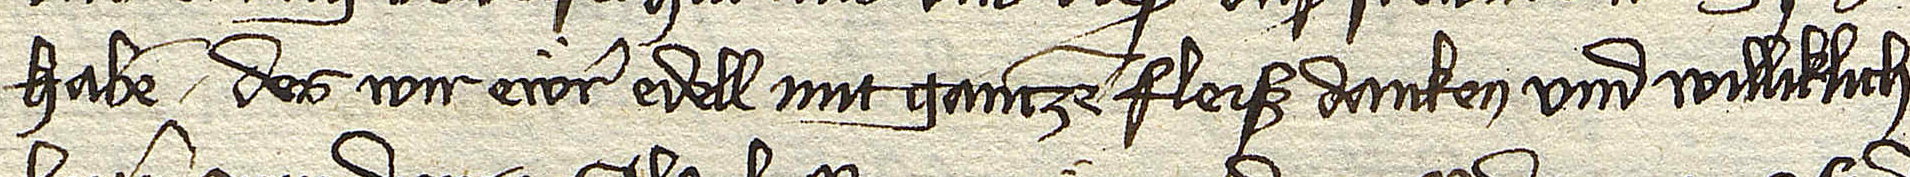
habe* / des wir ew*r edell mit gancʒe* fleiſʒ danken vnd williklich
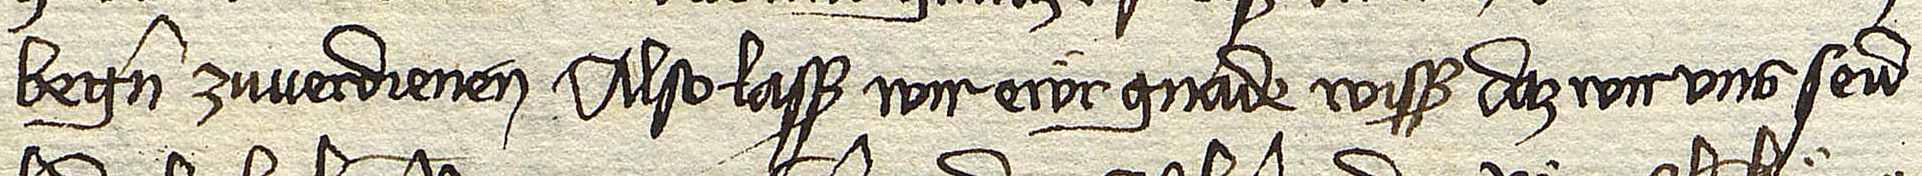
beg*n ʒuuerdienen / Alſo laſſ* wir ewr gnade wiſſ* daʒ wir vns ſeid
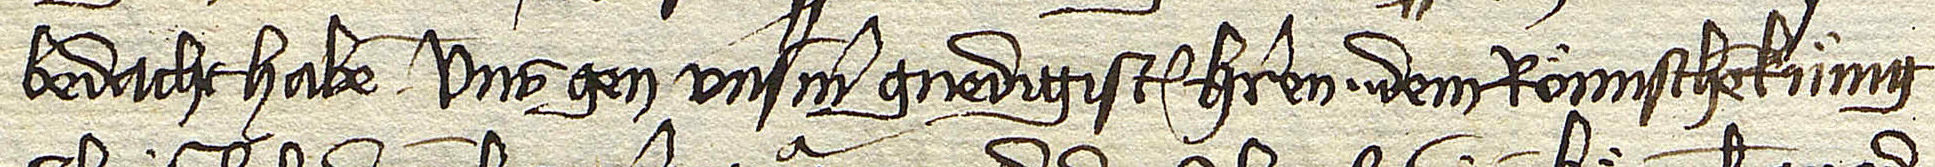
bedacht habe* . Vns gen vnſ*m gnedigiſt* h*ren ~ dem Römiſche* künig
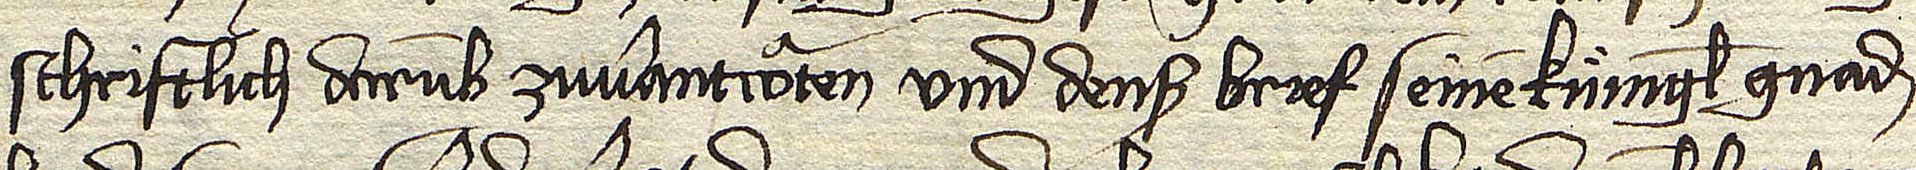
ſchriftlich daru*b ʒuu*antw*ten vnd denſ* brief ſeine* künigl* gnad*
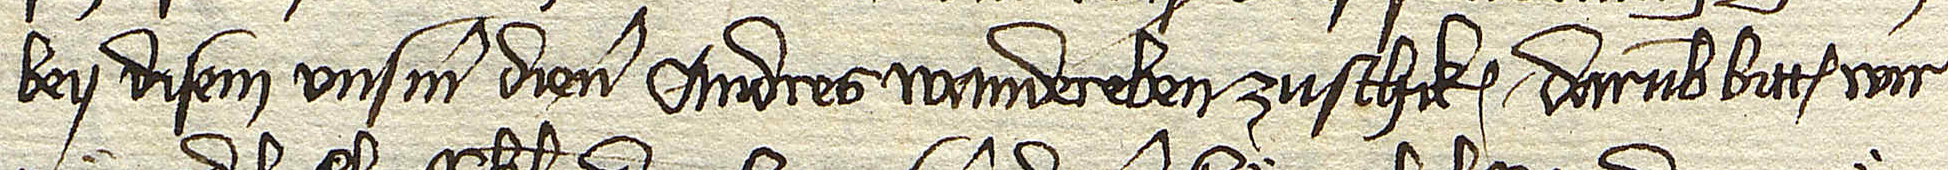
bey diſem vnſ*m dien* Andres wandereben ʒuſchik* / Daru*b bitt* wir
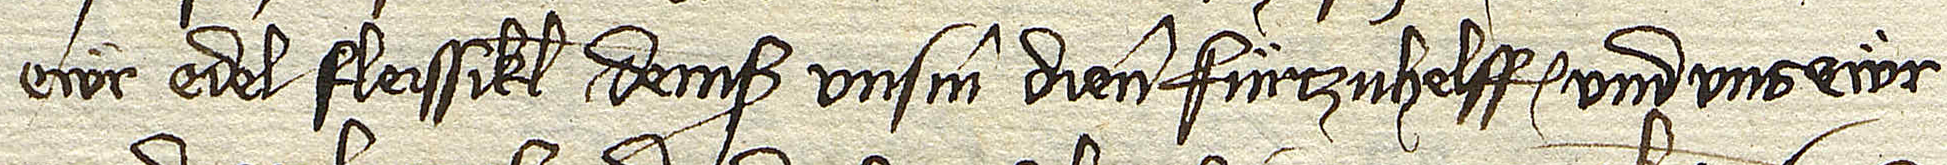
ewr edel fleiſſikl* / demſ* vnſ*m dien* fürcʒuhelff* vnd vns ewr
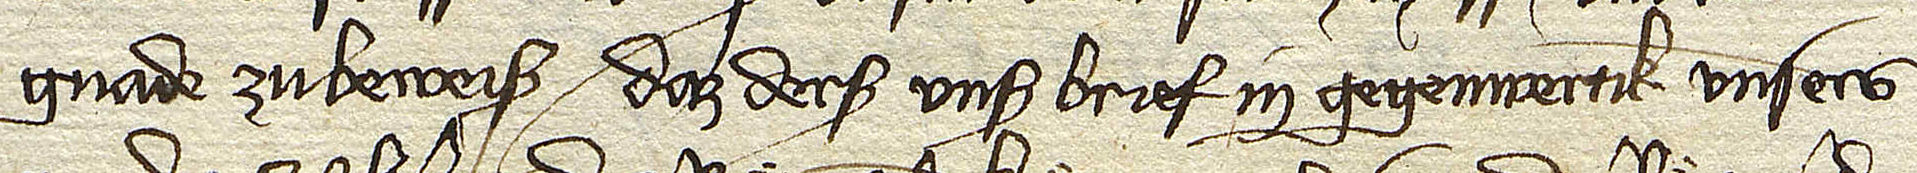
gnade ʒu beweiſ* daʒ derſ* vnſ* brief in gegenwertik* vnſers
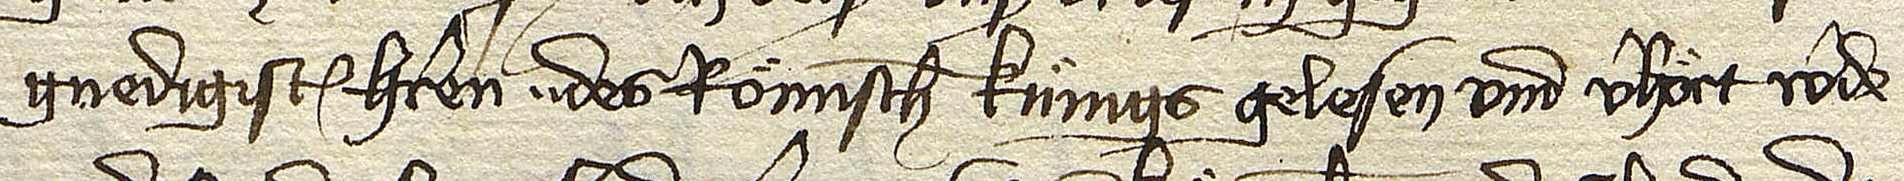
gnedigiſt* h*ren ~ des Römiſch* künigs geleſen vnd v*hört w*de
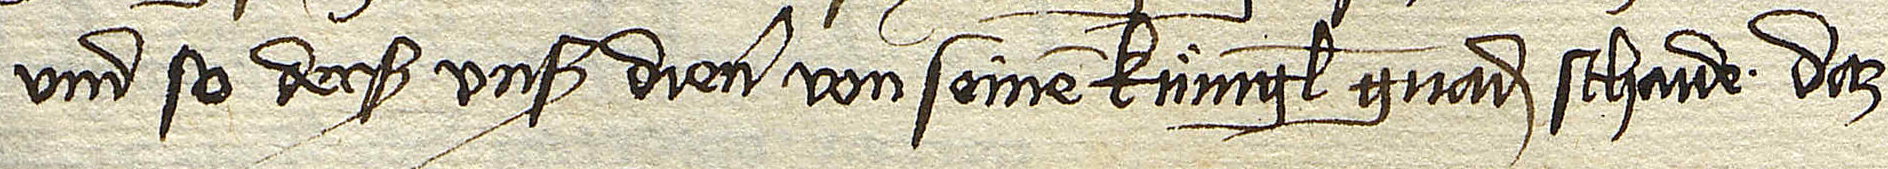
vnd ſo derſ* vnſ* dien* von ſeine* künigl* gnad* ſchaide . daʒ
